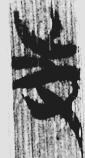寺（持）
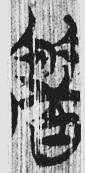箸（書）
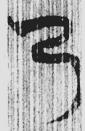乃
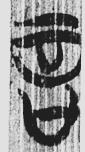言
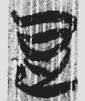是
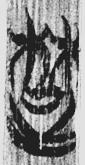楚
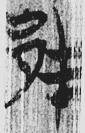邦
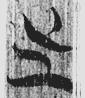之
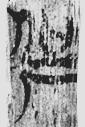○（強）
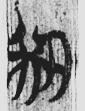○（梁）
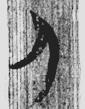人
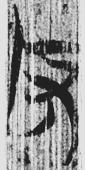反
